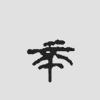不
